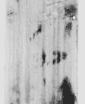身
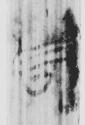{㠯ㅋ}
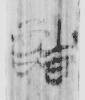詰
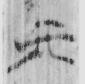亓
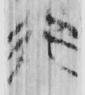行
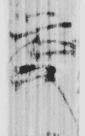{卞又}
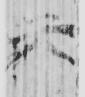亓
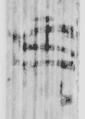正
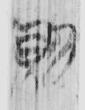則
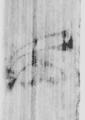民
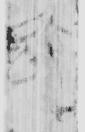攺
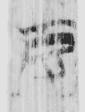皮
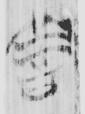善
